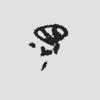𠭁
